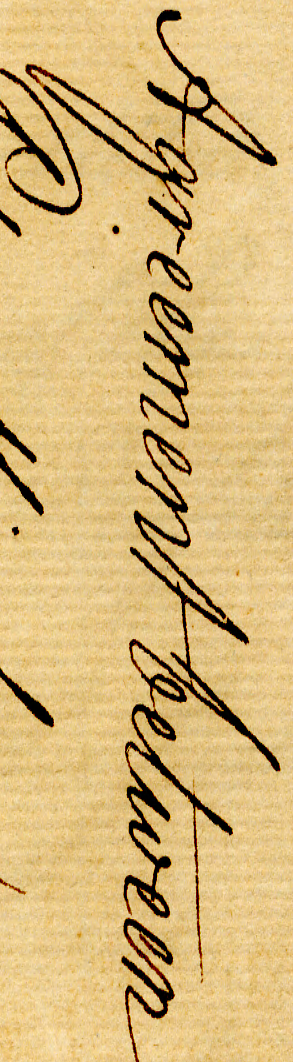Agreement between
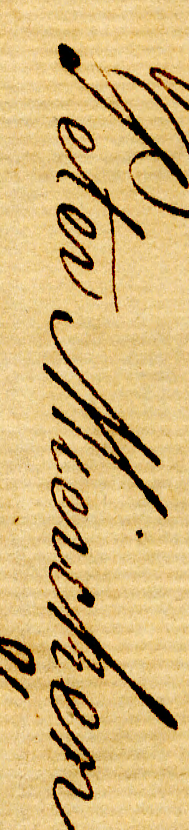Peter Miercken
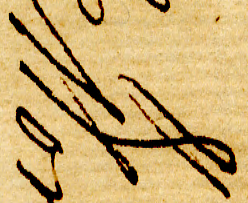&
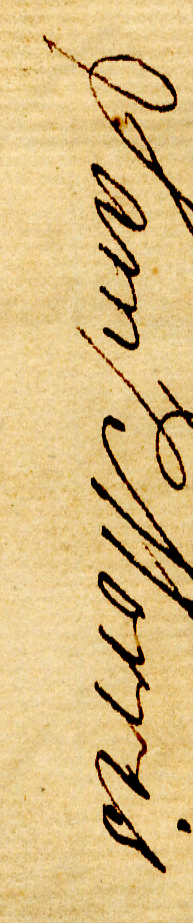Saml Morris
